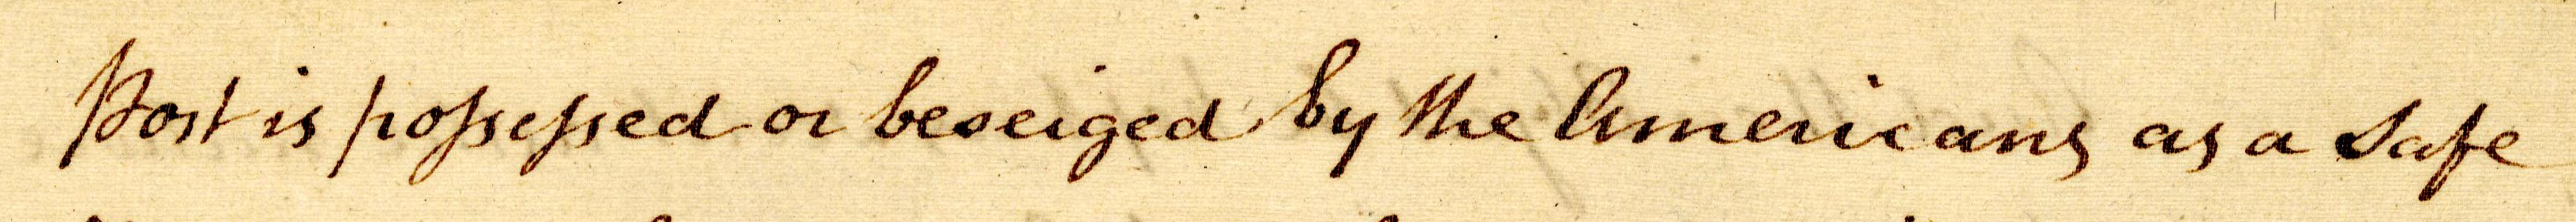Post is possessed or beseiged by the Americans as a safe
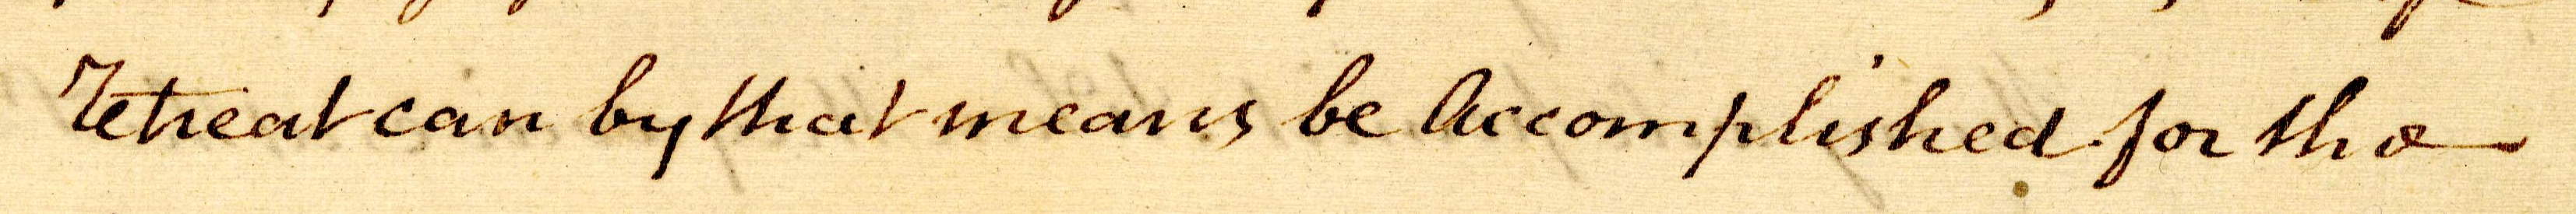retreat can by that means be Accomplished for the
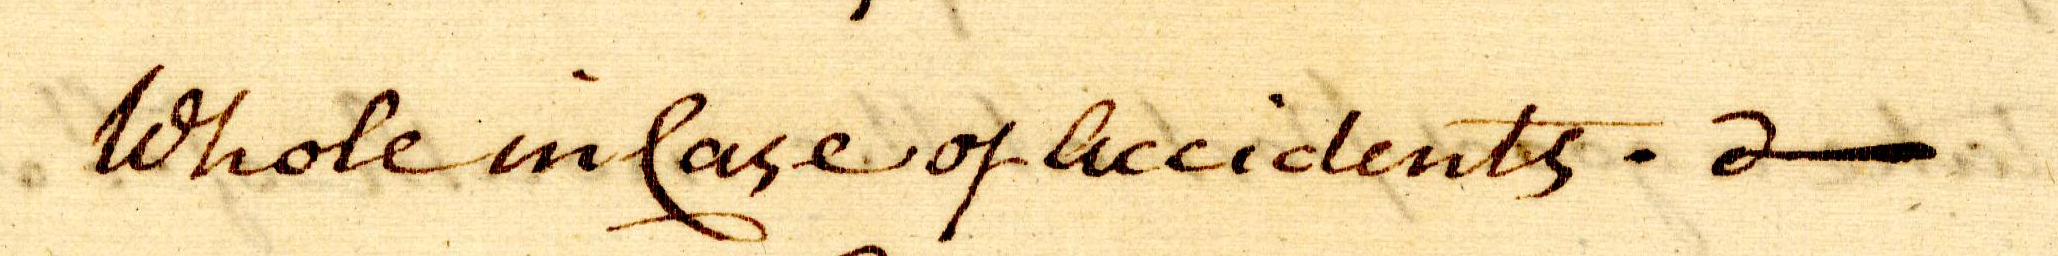Whole in Case of Accidents.-
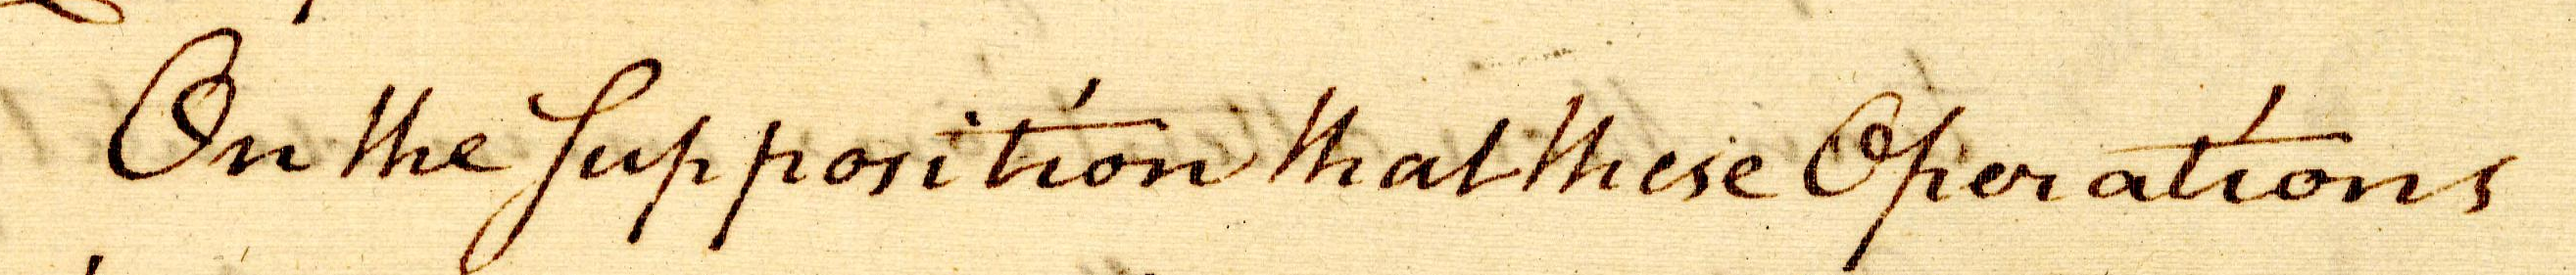On the supposition that these Operations
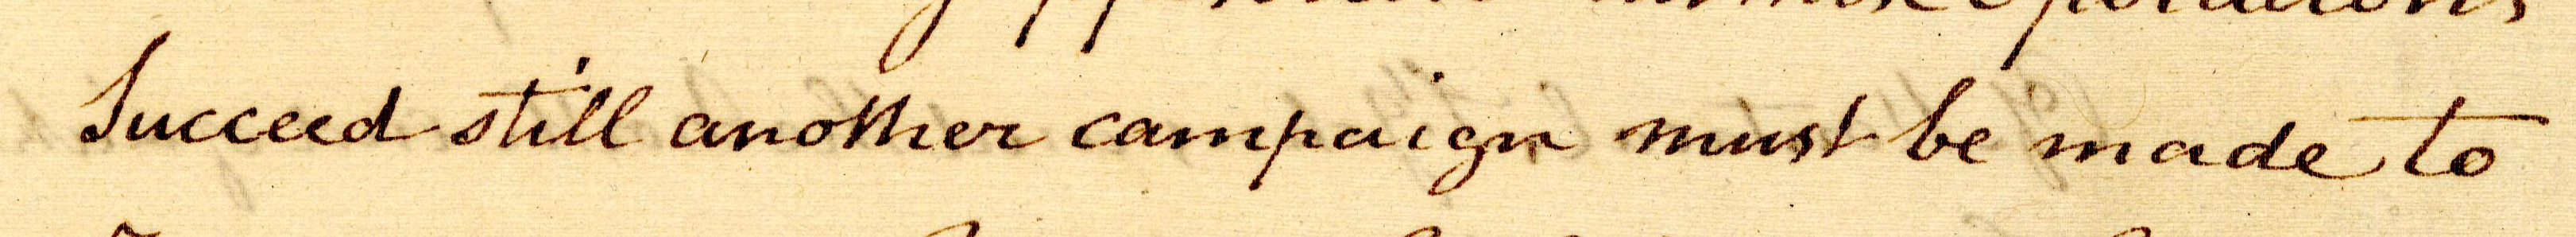Succeed still another campaign must be made to
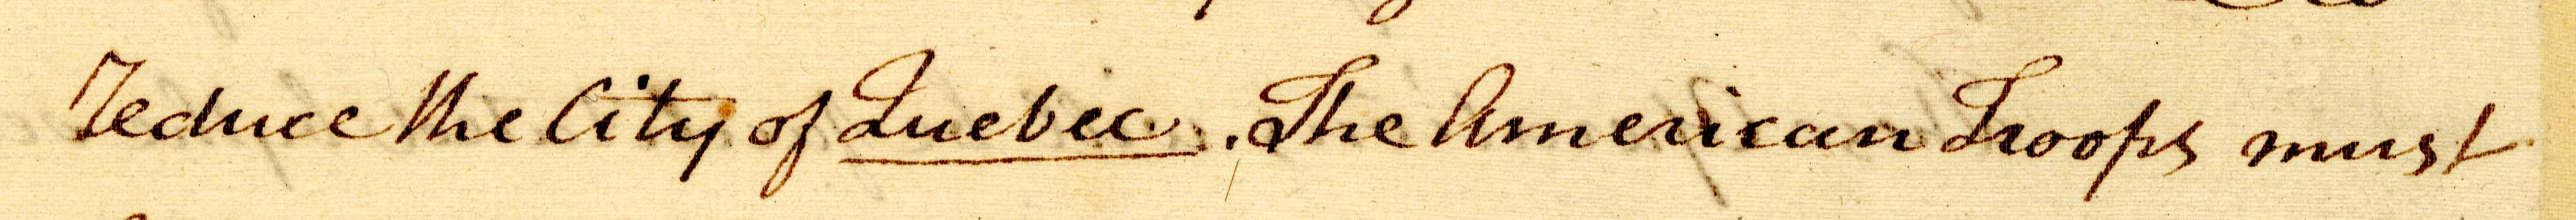reduce the City of Quebec. The American Troops must
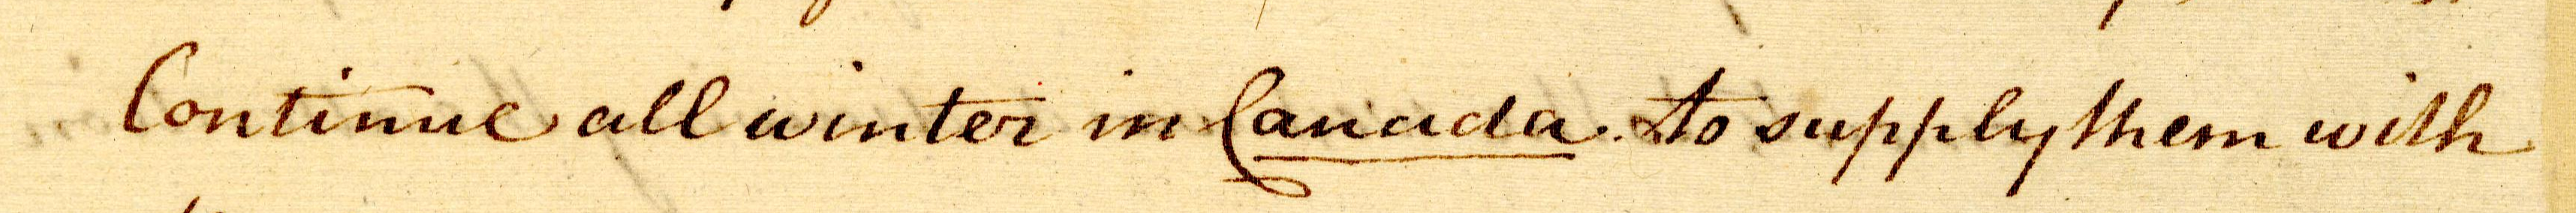Continue all winter in Canada to supply them with
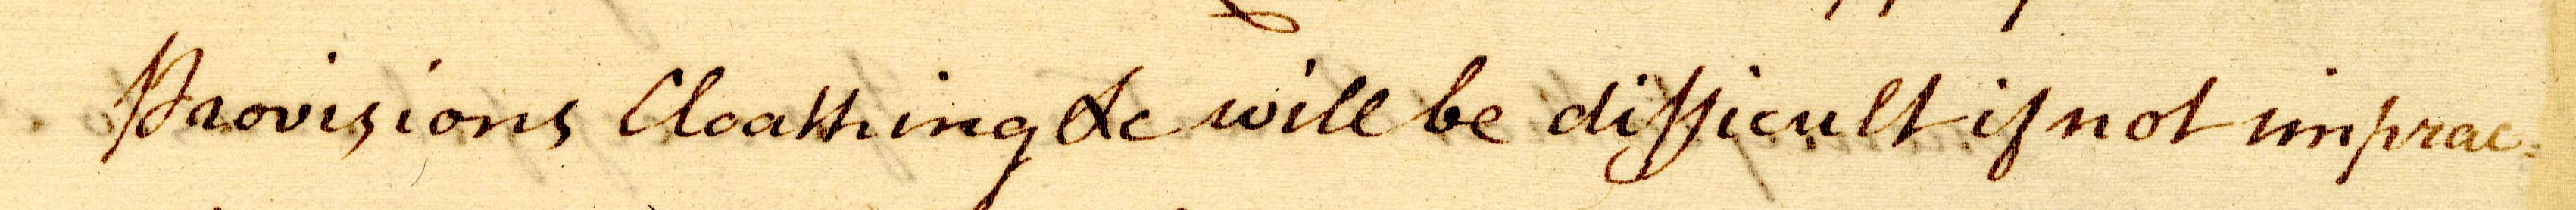provisions Cloathing &c will be difficult if not imprac-
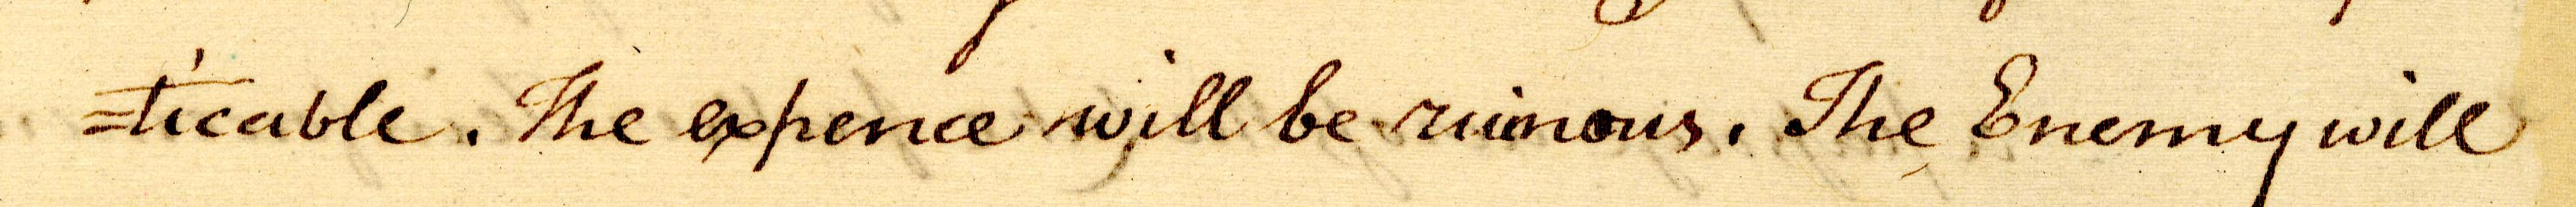-ticable. The expence will be ruinous. The Enemy will
